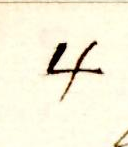4
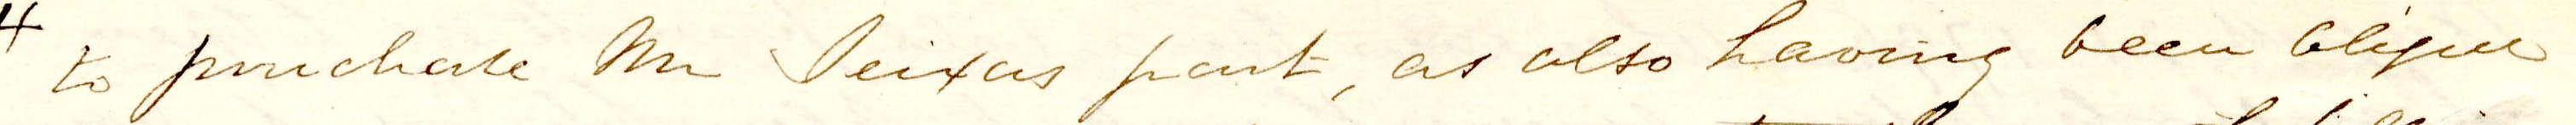to purchase Mr Seixas part as also having been bliged
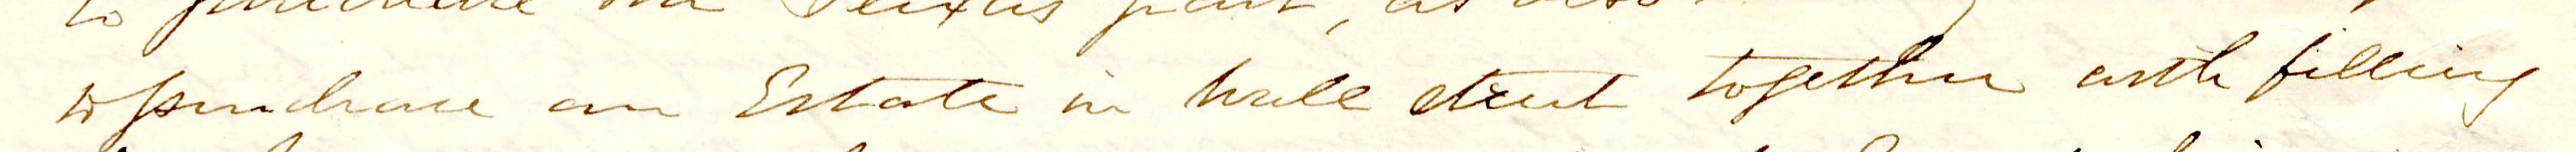to purchase an Estate in Wall street together with filling
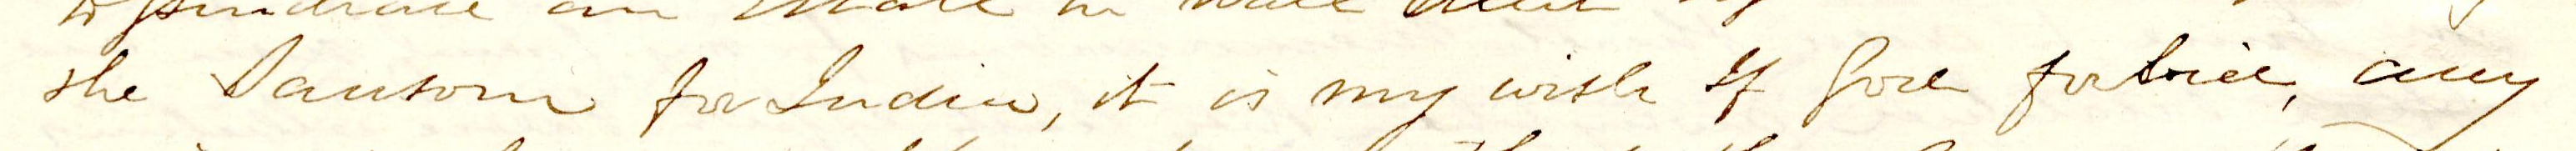the Sansom for India it is my wish If God forbid, any
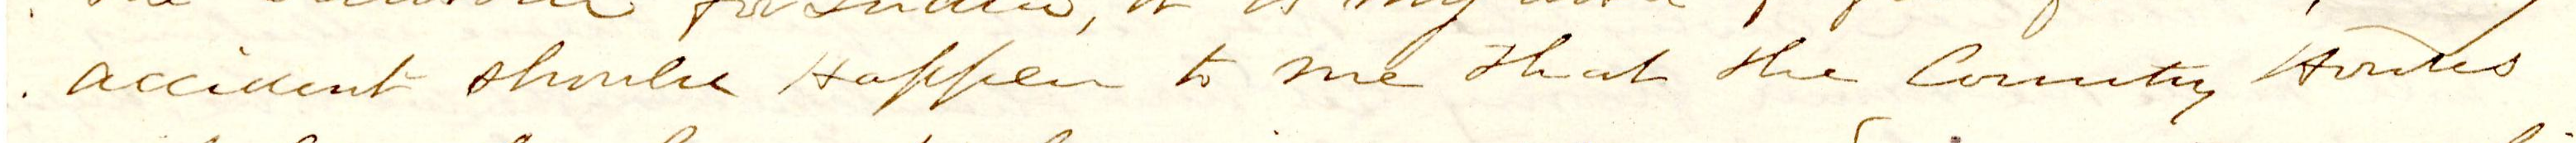accident should happen to me that the Country acres
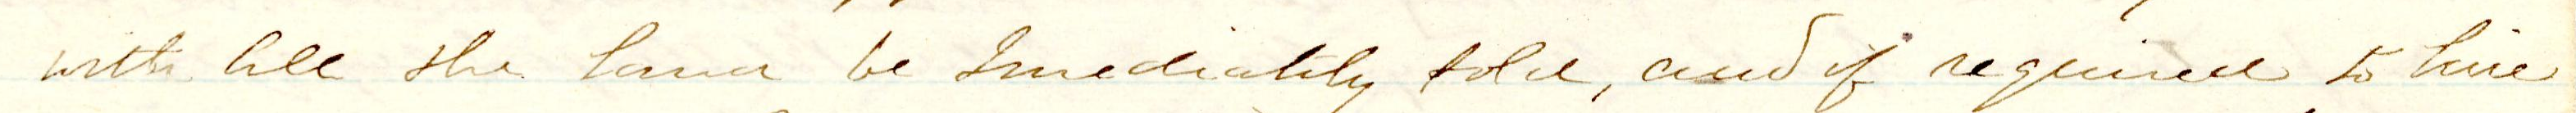with all the Land be immediately sold, and if required to live
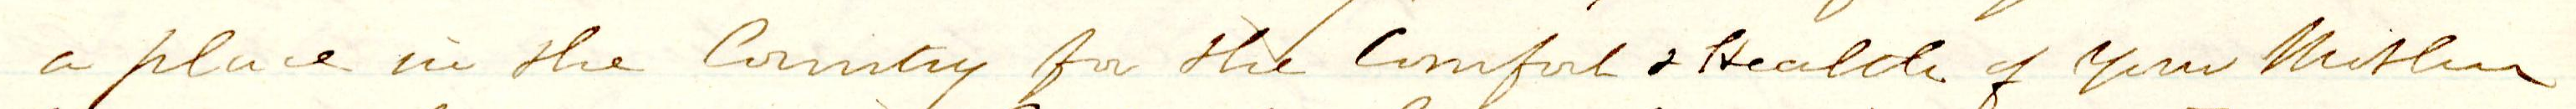a place in the Country for the Comfort & Health of Your mother
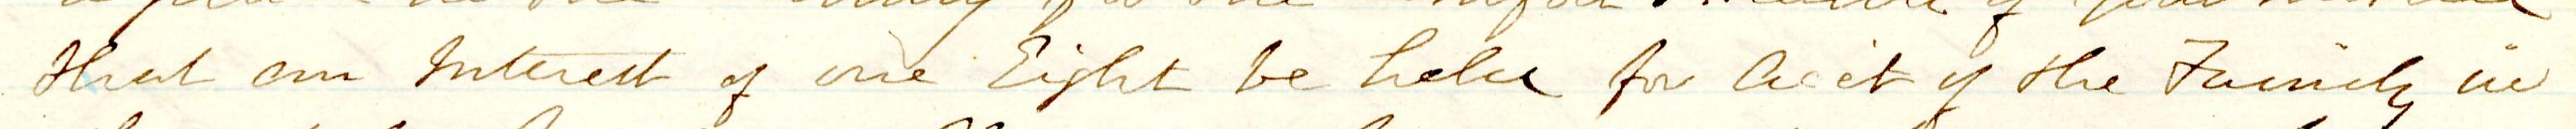that an interest of one Eight be held for Acc't of the Family in
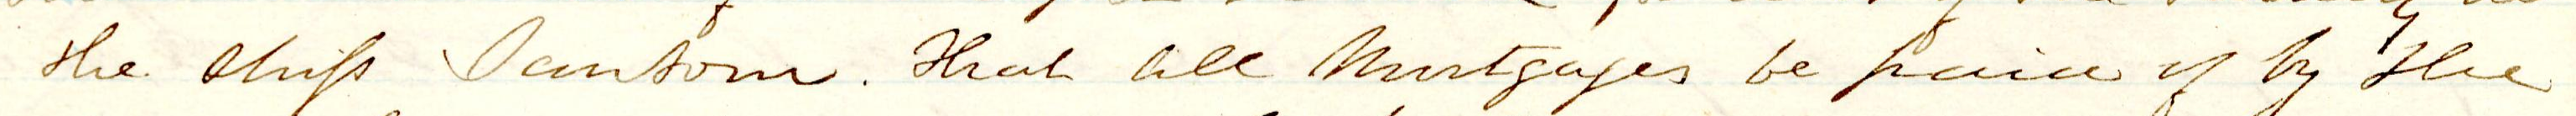the ships Sansom That all mortgages be paid of by the
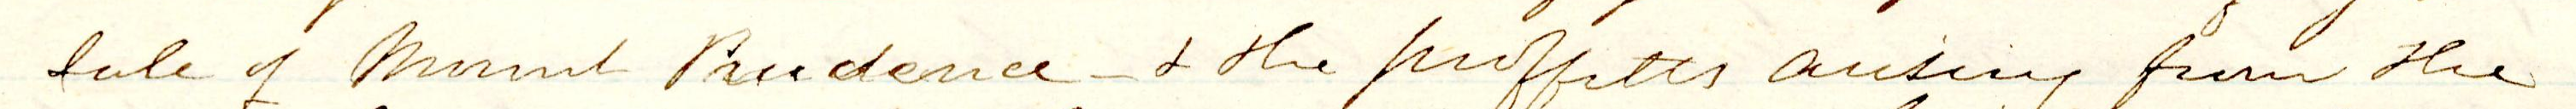sale of moment prudence.- & the proffitts arising from the
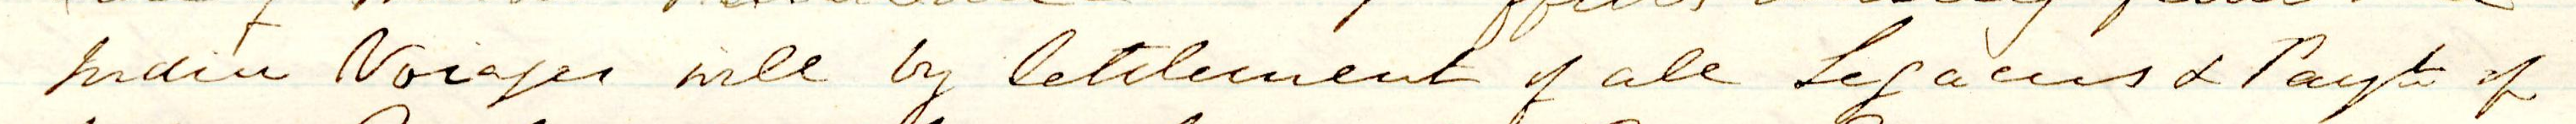paid Voiages will by settlement of all Legacies & Pay^ts of
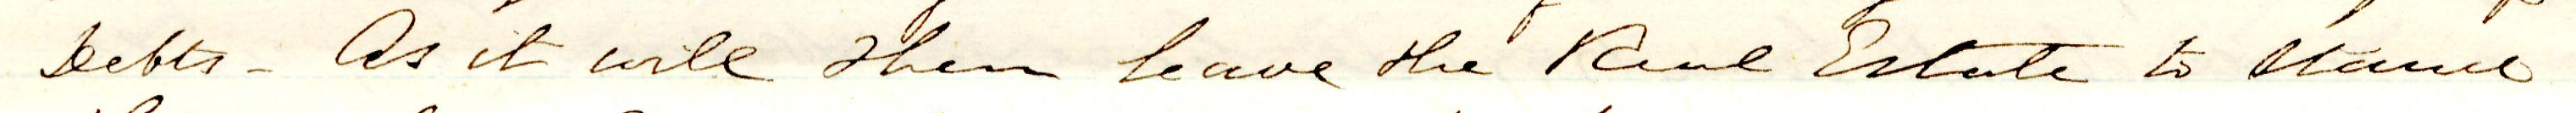Delts- As it will then leave the Real Estate to stand
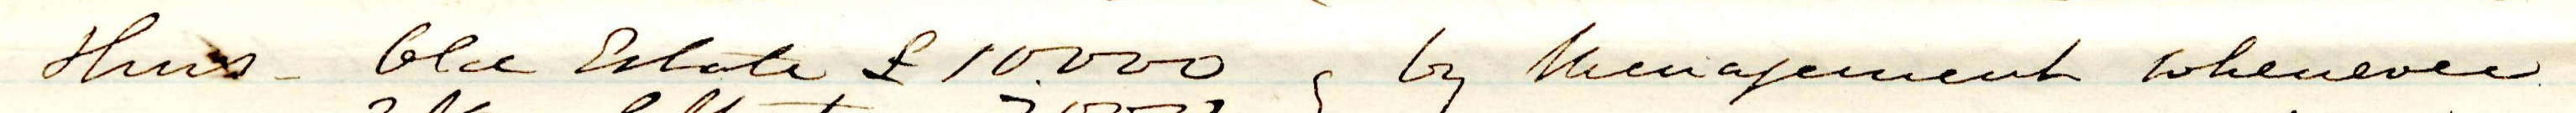thus- Old Estate £10.000 by management whenever
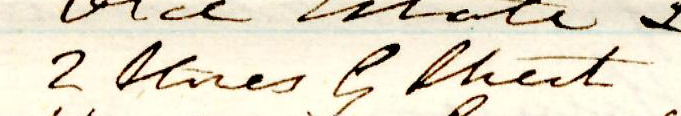2 Skines & Sheet
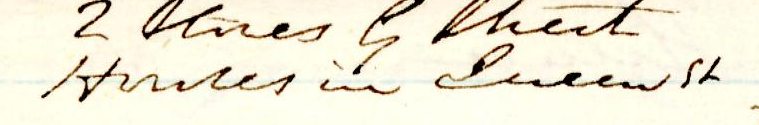Houses in Queen St
